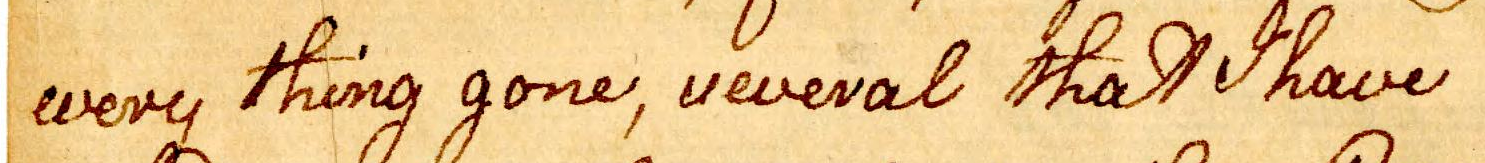every thing gone, several that I have
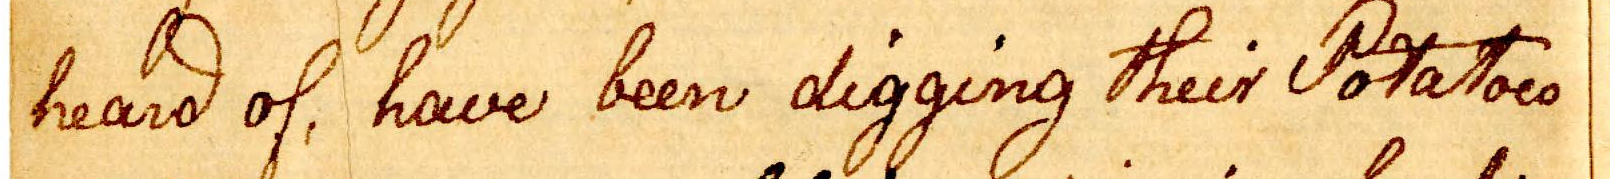heard of, have been digging their Potatoes
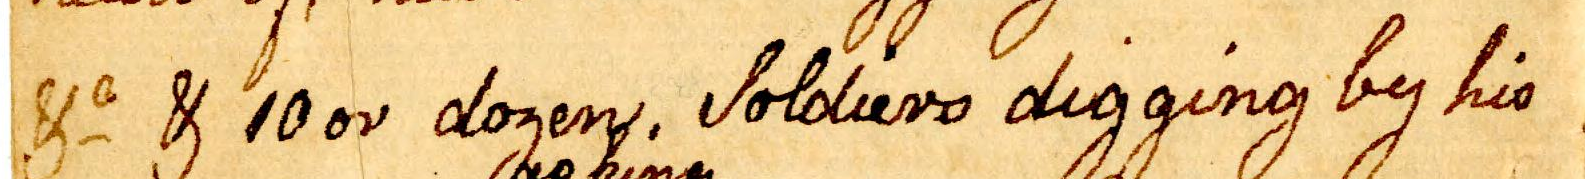&^c & 10 or dozen, Soldiers digging by his
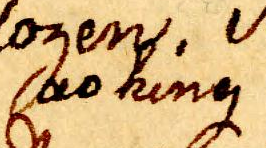asking
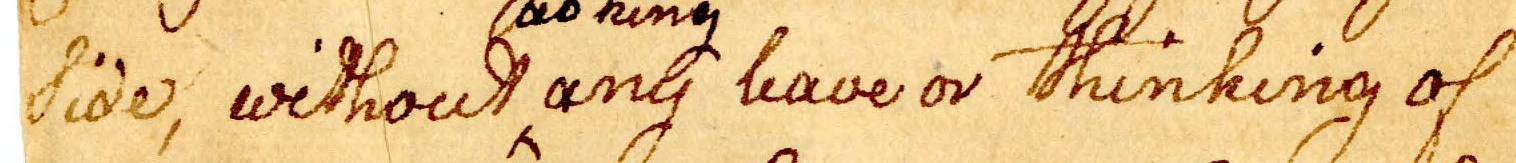Side, without ^ any leave or thinking of
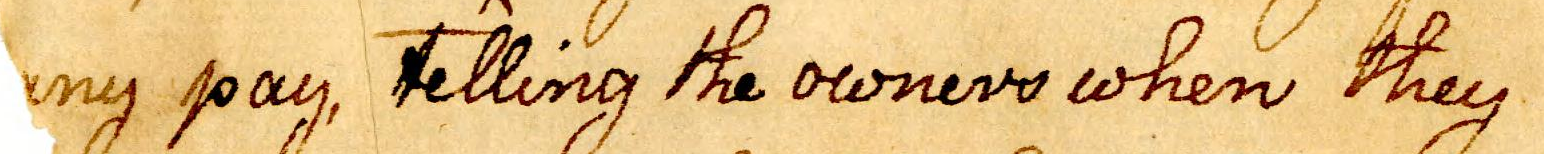[a]ny pay, telling the owners when they
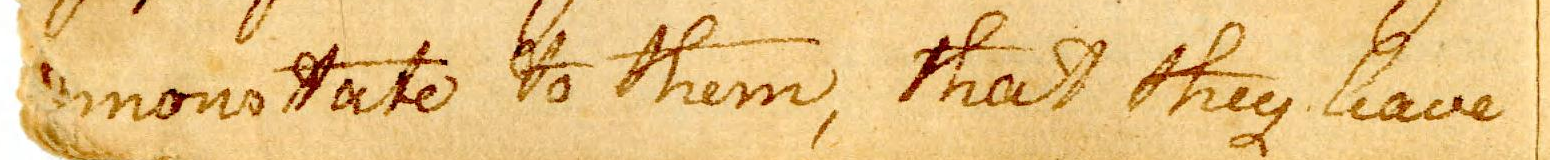monstate to them, that they leave
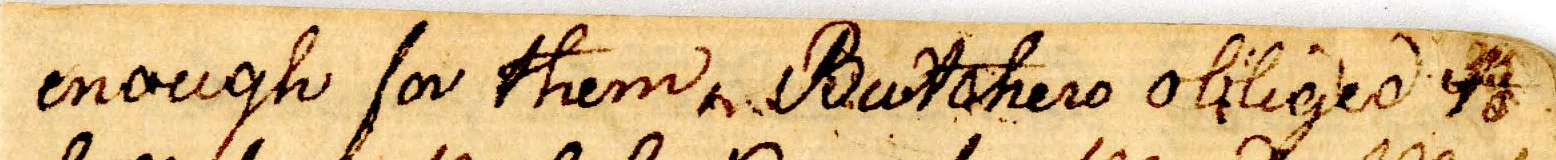enough for them, Butchers obliged to
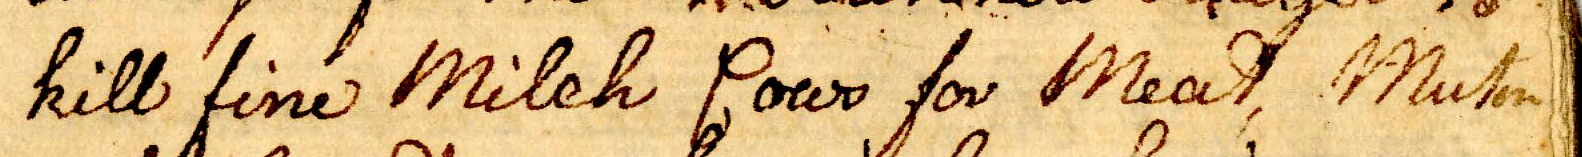kill fine Milch Cows for Meat, Muton
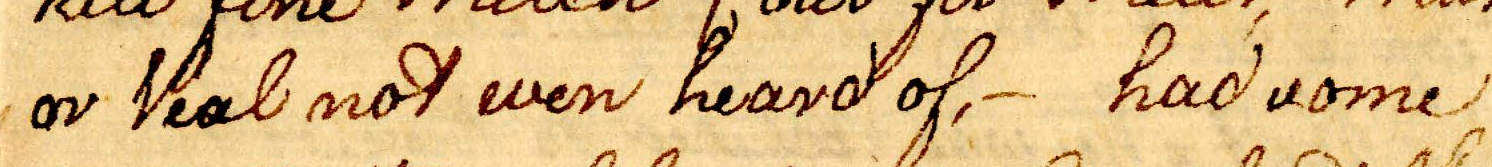or Veal not even heard of,- had some
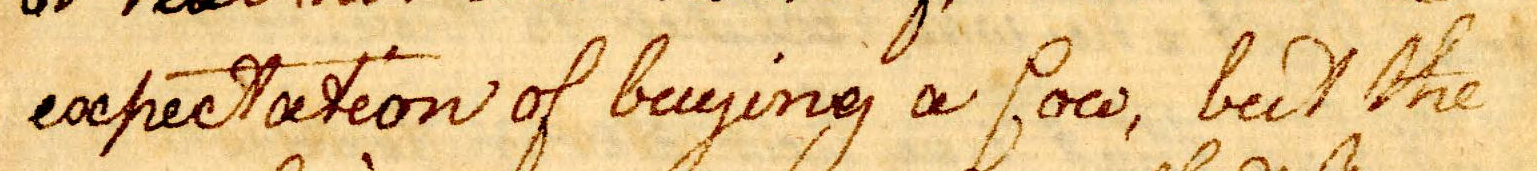expectation of buying a Cow, but the
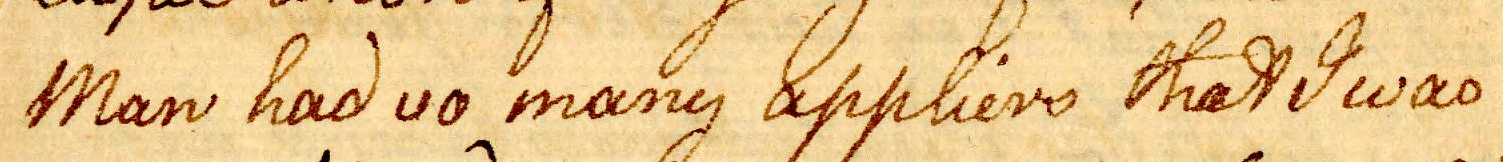Man had so many appliers that I was
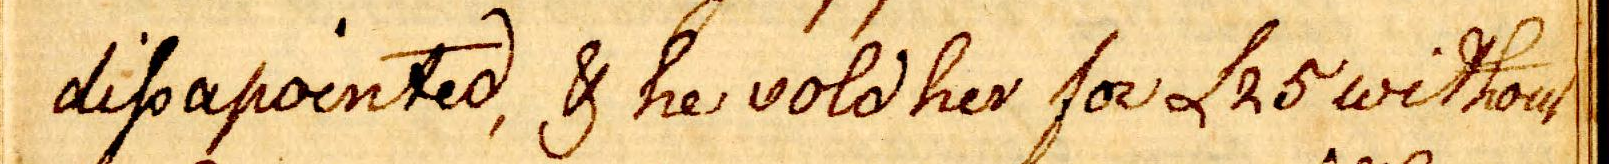dissapointed, & he sold her for £25 without
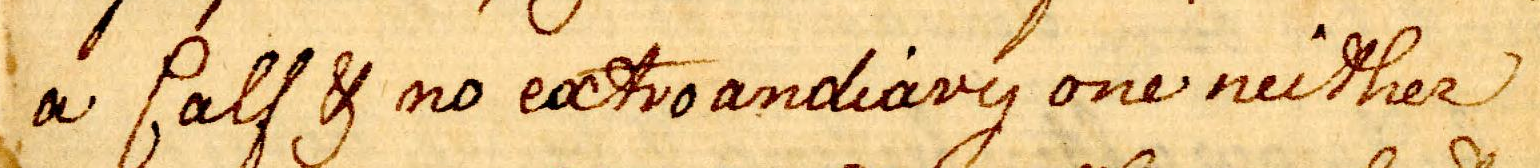a Calf & no extroandiary one neither
